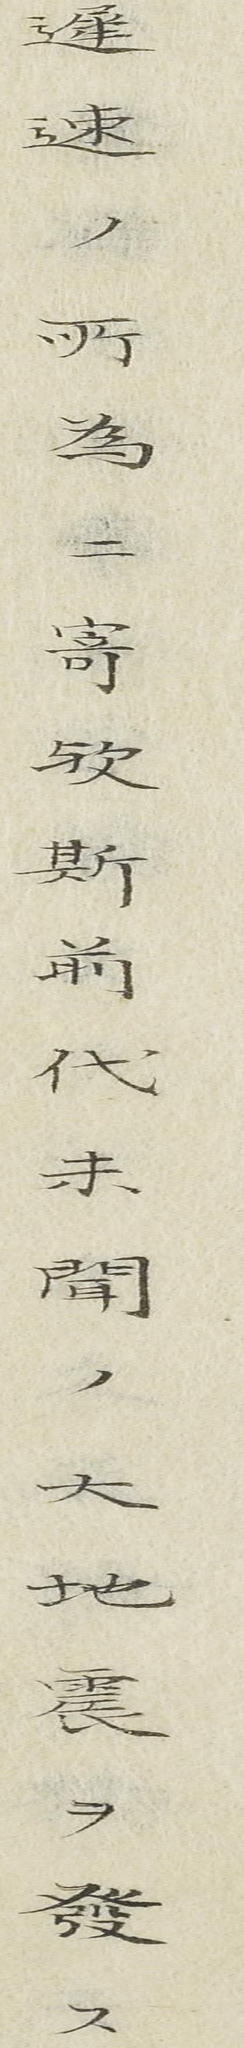遅速ノ所為ニ寄歟斯前代未聞ノ大地震ヲ発ス
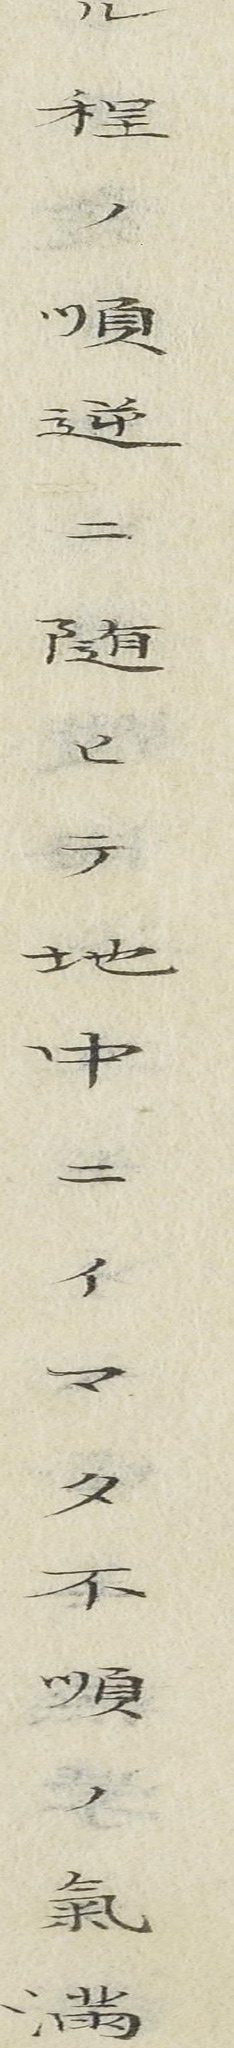ル程ノ順逆ニ随ヒテ地中ニイマタ不順ノ気満

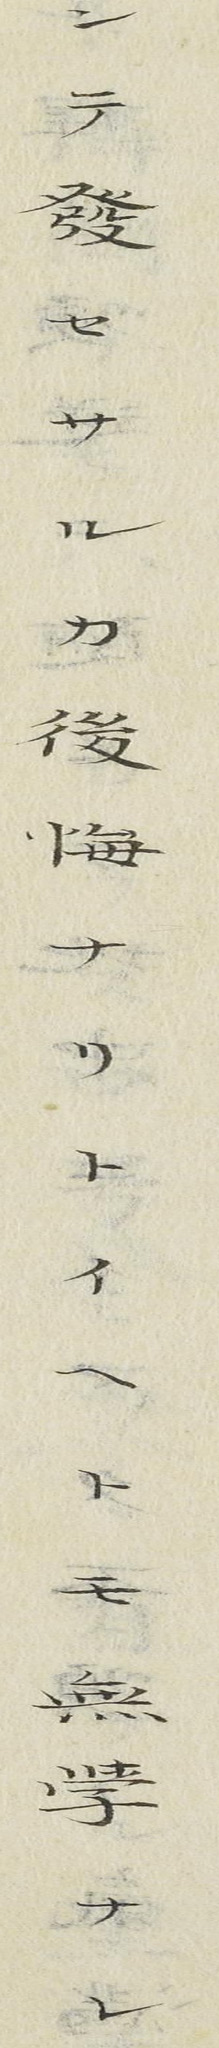シテ発セサルカ後悔ナリトイヘトモ無学ナレ
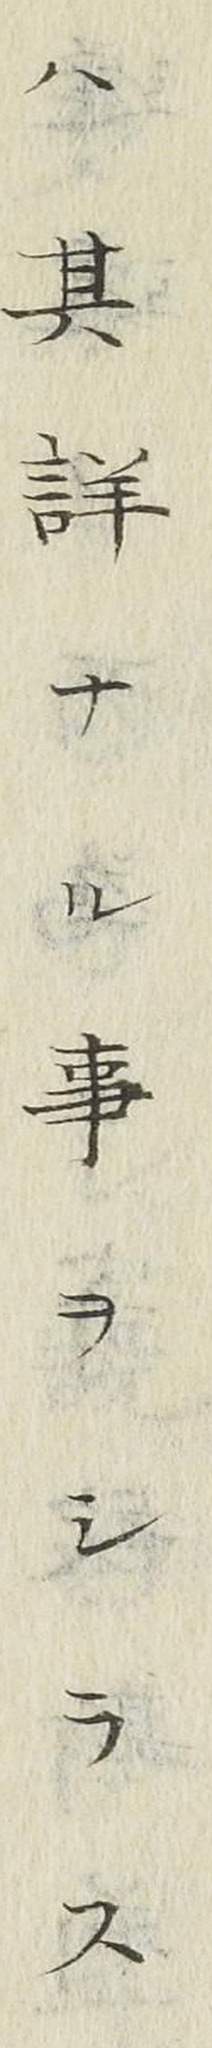ハ其詳ナル事ヲシラス
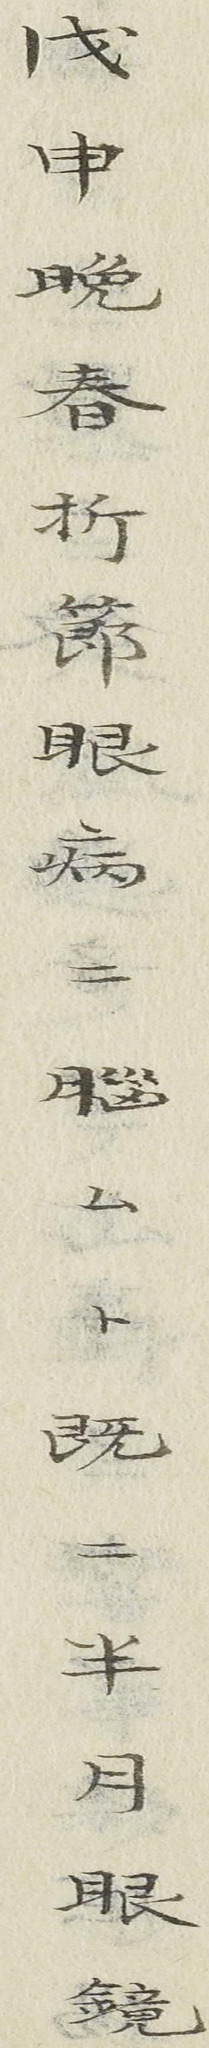戊申晩春折節眼病ニ悩ムト既ニ半月眼鏡
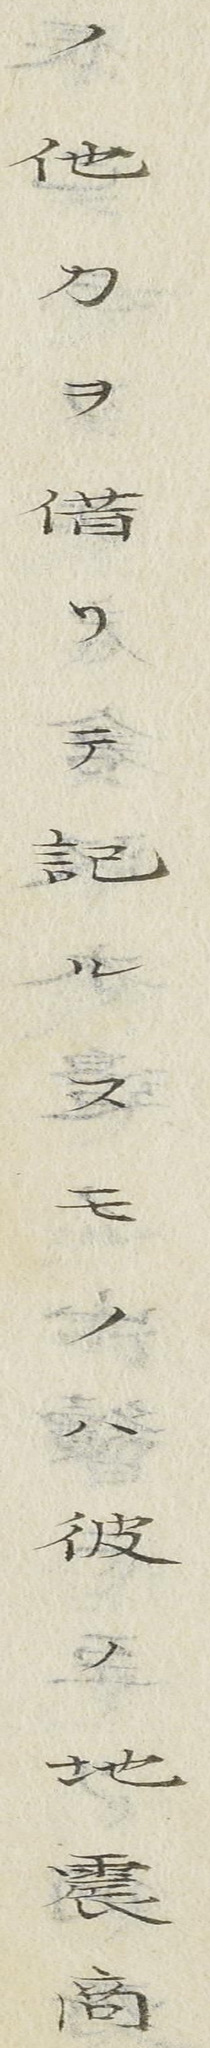ノ他力ヲ借リテ記ルスモノハ彼ノ地震商
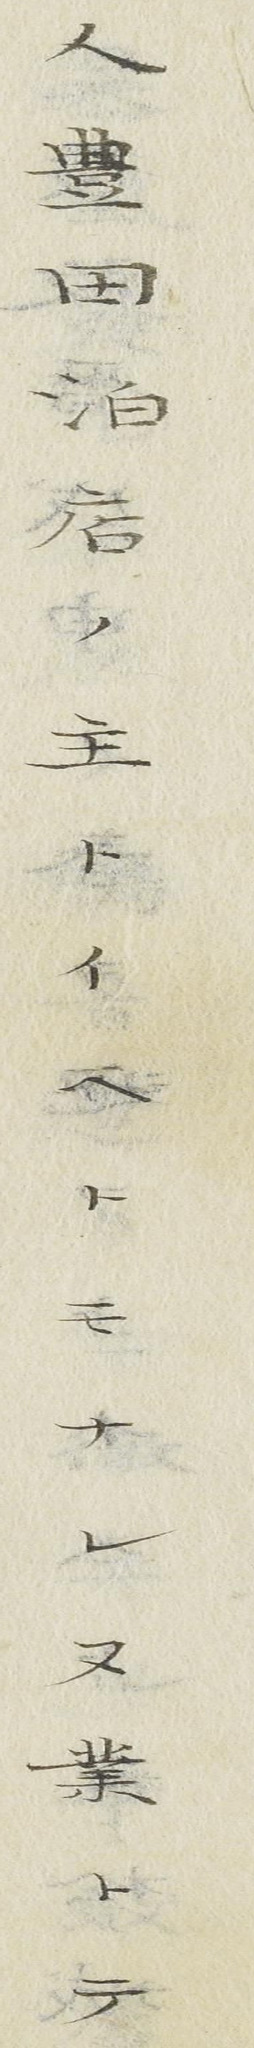人豊田泊店ノ主トイヘトモナレヌ業トテ
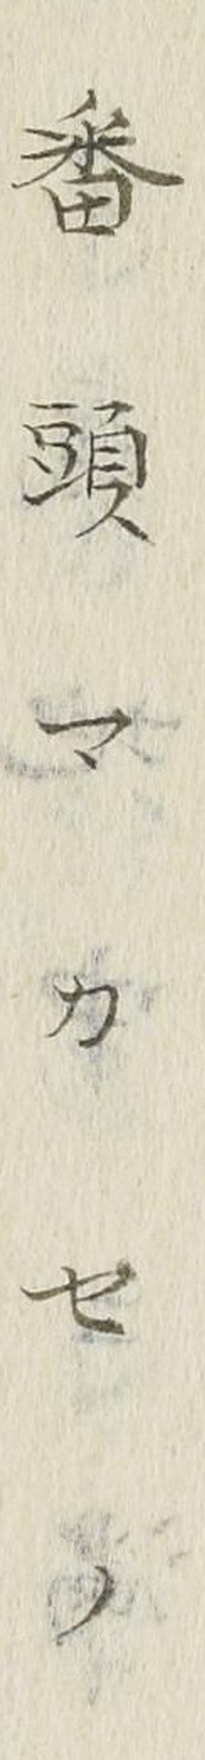番頭マカセノ
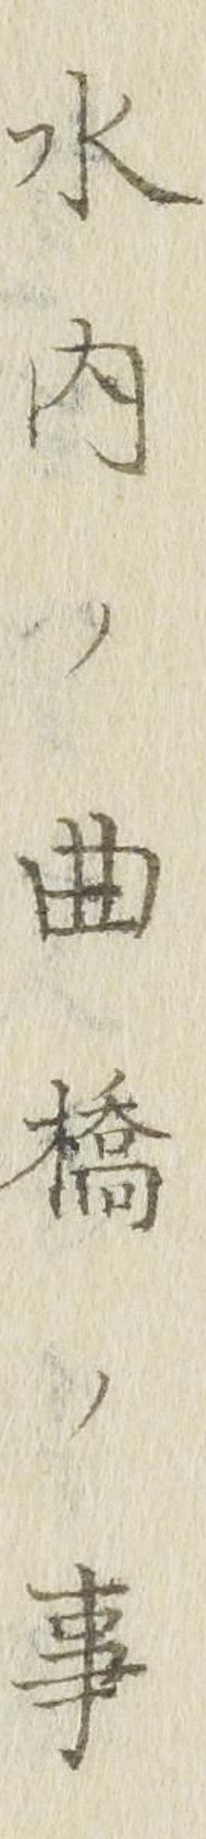水内ノ曲橋ノ事
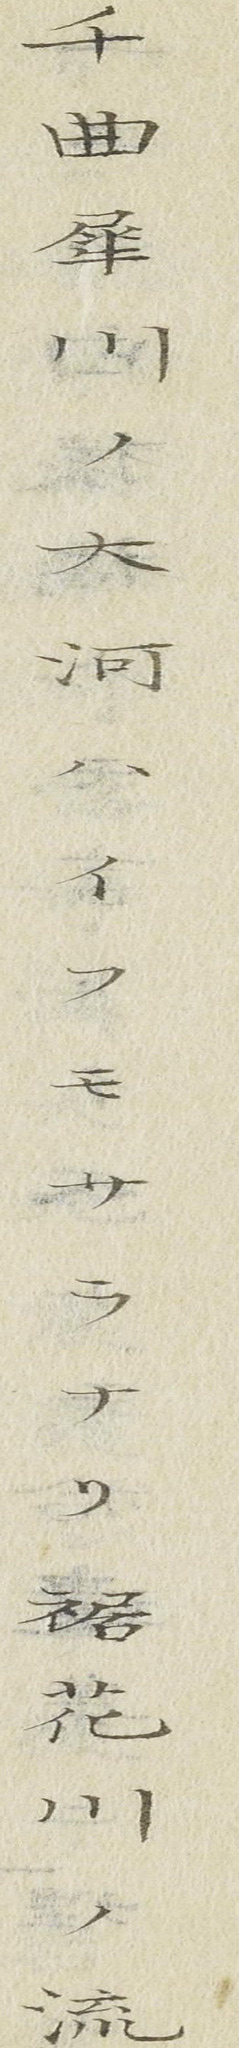千曲犀川ノ大河ハイフモサラナリ裾花川ノ流
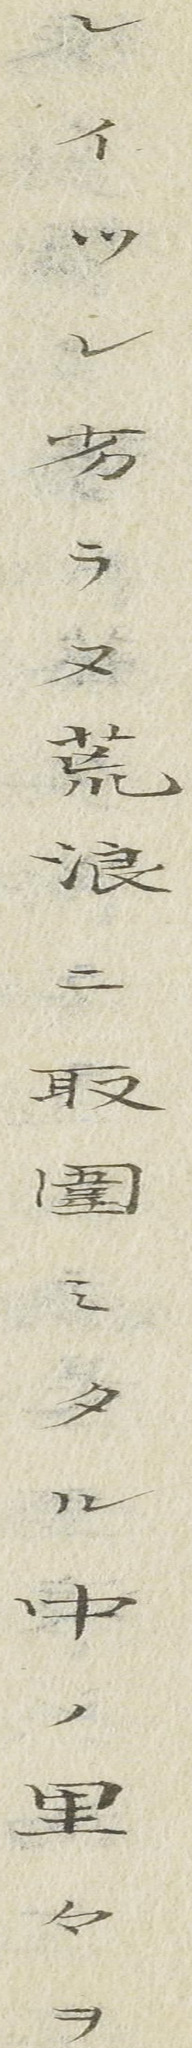レイツレ劣ラヌ荒波ニ取囲ミタル中ノ里々ヲ
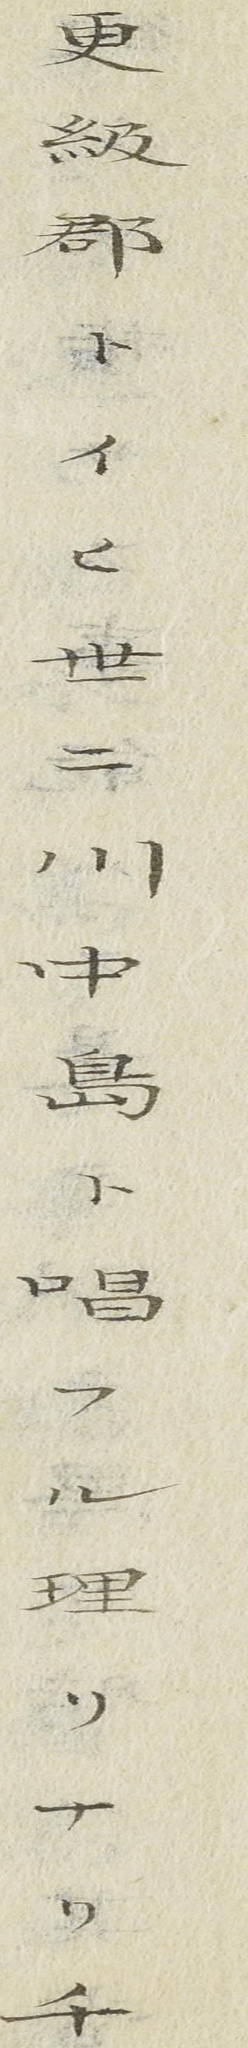更級群トイヒ世ニ川中島ト唱フル理リナリ千
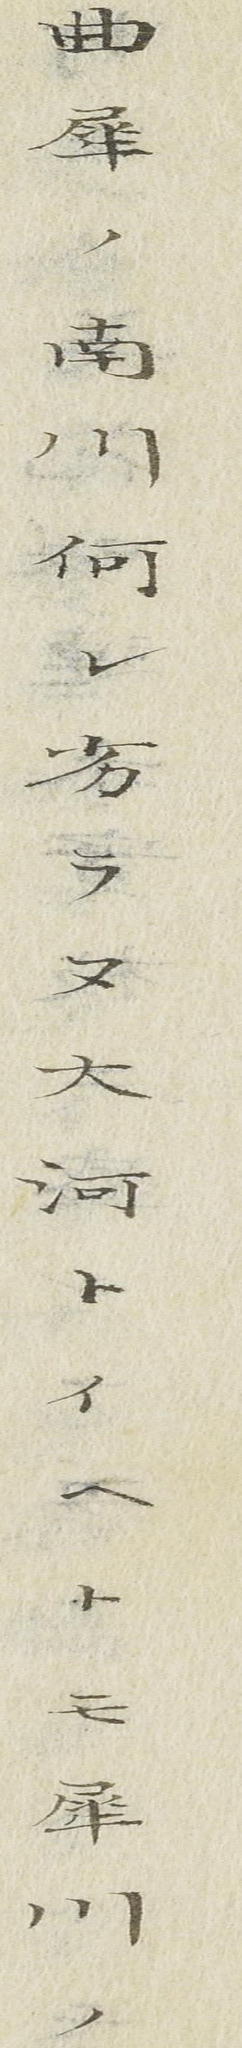曲犀ノ南川何レ劣ラヌ大河トイヘトモ犀川ノ
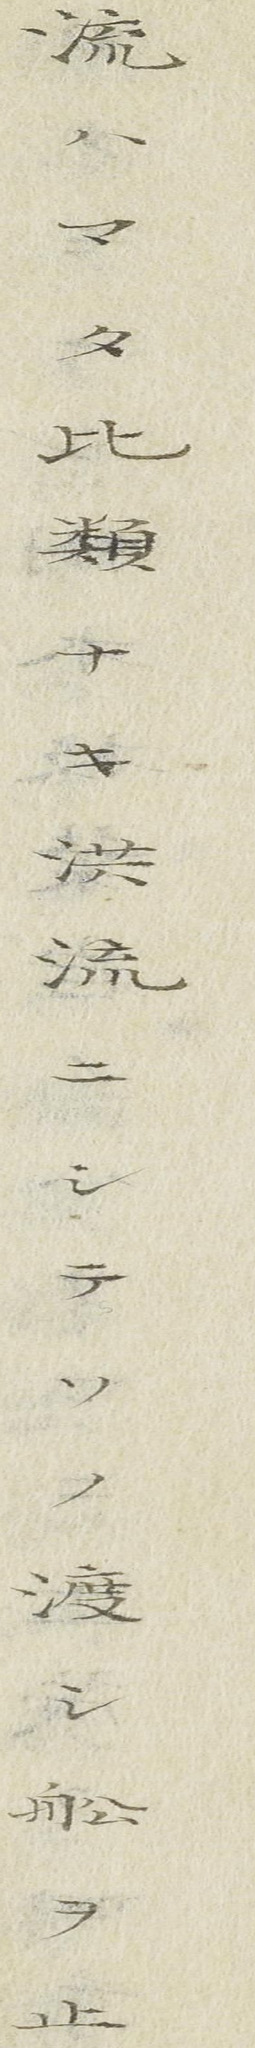流ハマタ此類ナキ洪流ニシテソノ渡シ舩ヲ止
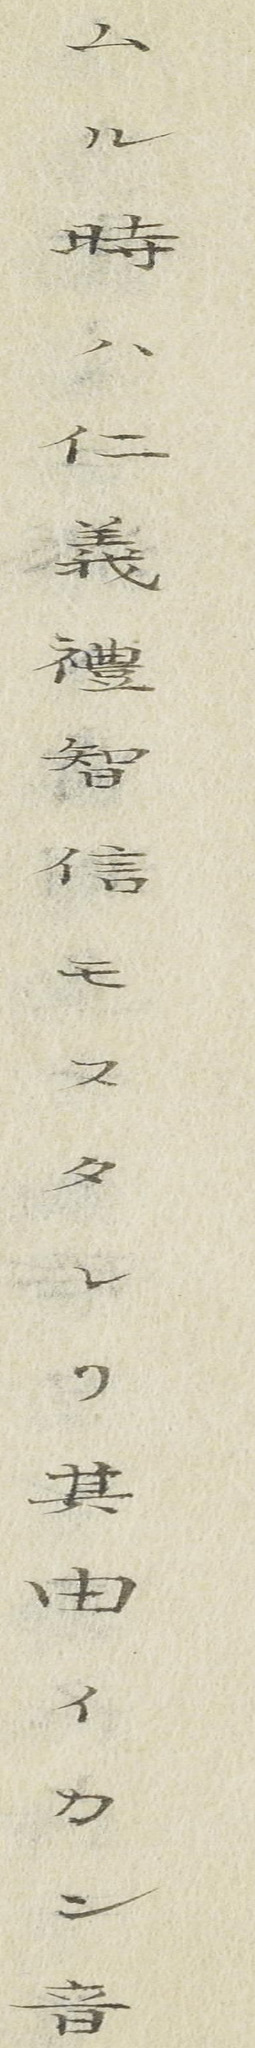ムル時ハ仁義禮智信モスタレリ其由イカン音
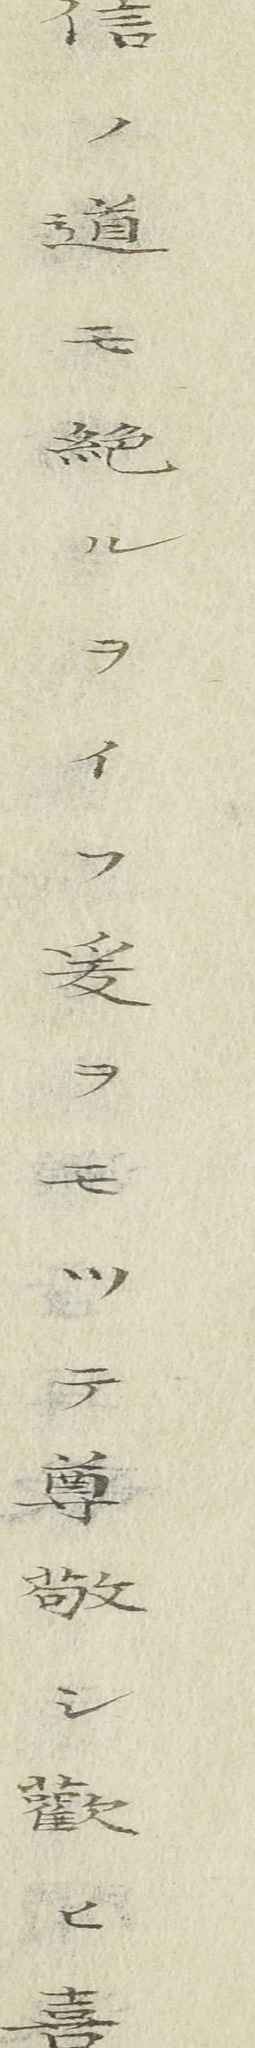信ノ道モ絶ルヲイフ爰ヲモツテ尊敬シ歓ヒ喜
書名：地災撮要　地震之部　巻ノ二
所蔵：東京大学地震研究所図書室 Earthquake Research Institute Library, The University of Tokyo, JAPAN
